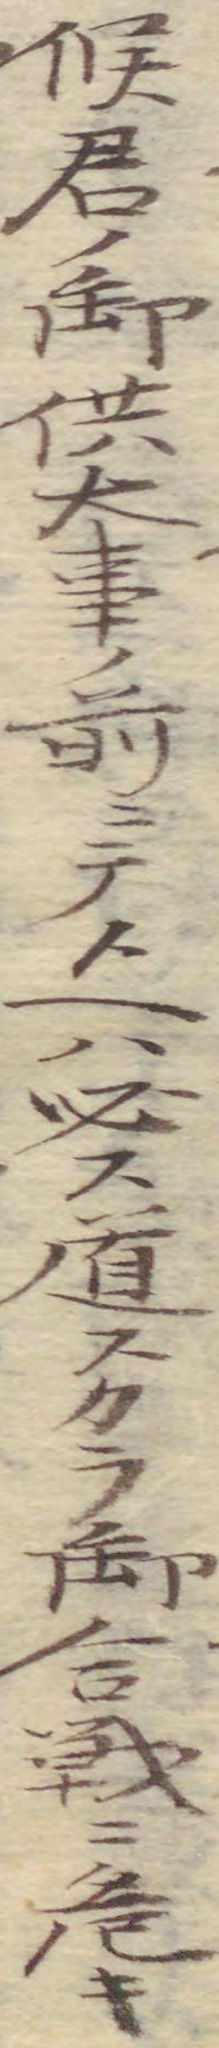候君ノ御供大事ノ前ニテ候ヘハ必ス道スカラ御合戦ニ危キ
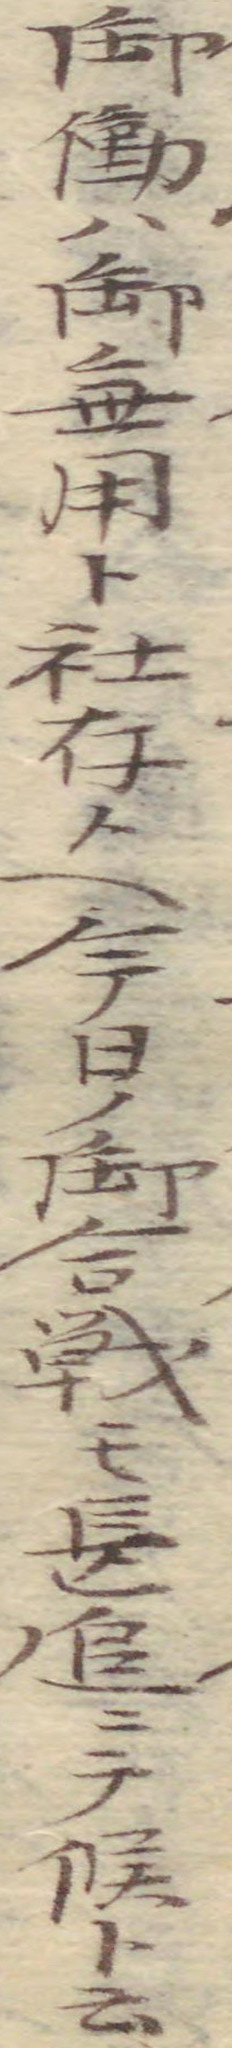御働ハ御無用ト社存候ヘ今日ノ御合戦モ長追ニテ候ト云
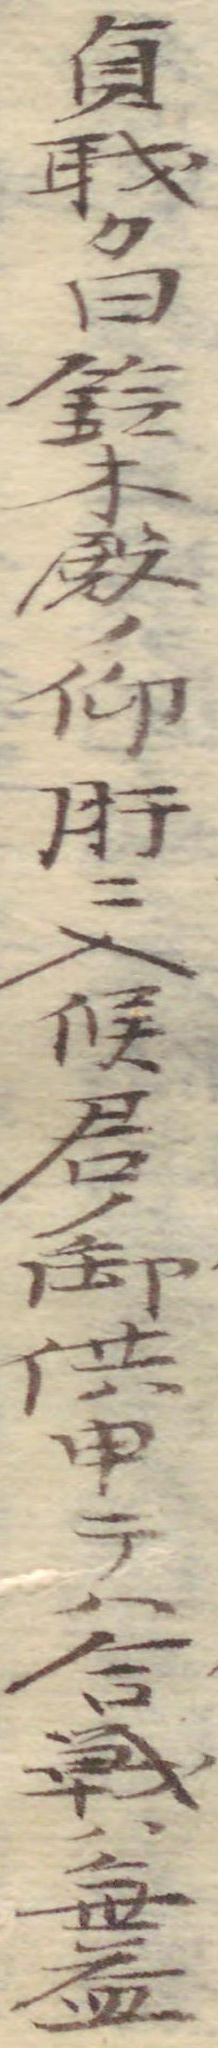貞職カ曰鈴木殿ノ仰肝ニ入候君ノ御供申テハ合戦ハ無益
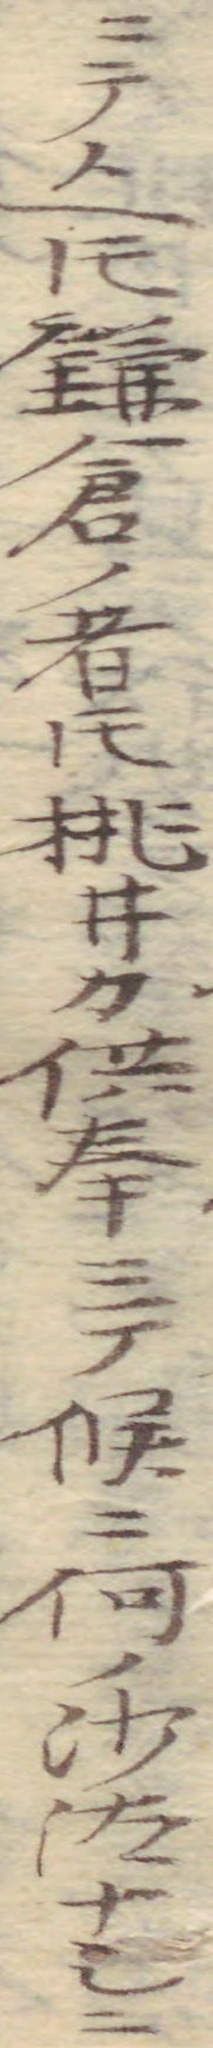ニテ候ヘトモ鎌倉ノ者トモ桃井カ供奉ニテ候ニ何ノ沙汰ナシニ
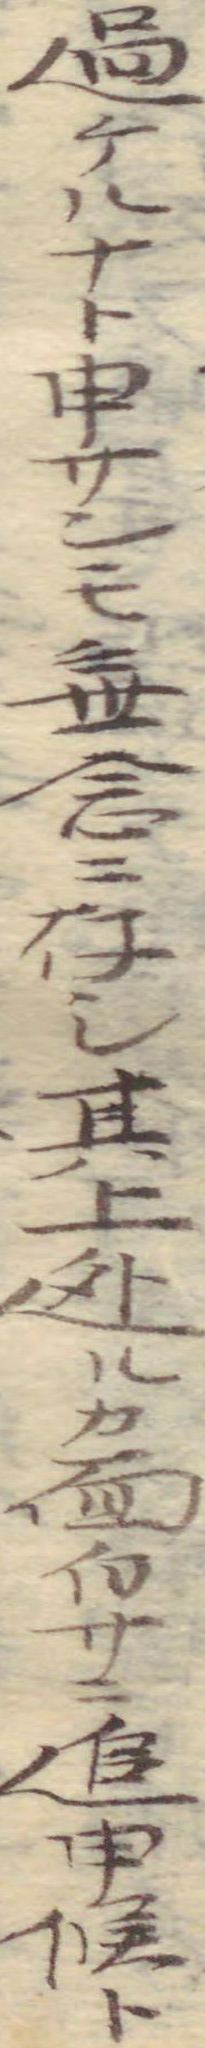過ケルナト申サンモ無念ニ存シ其上逃ルカ面白サニ追申候ト
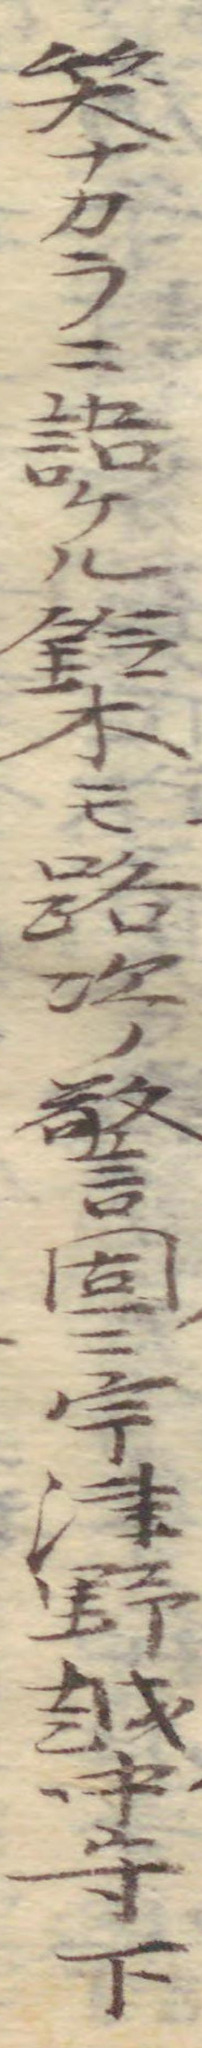笑ナカラニ語ケル鈴木モ路次ノ警固ニ宇津野越中守下
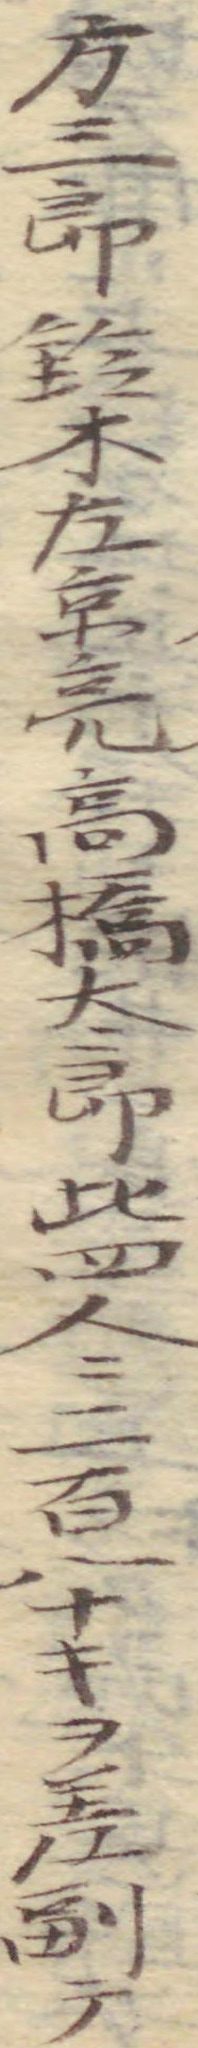方三郎鈴木左京亮高橋太郎此四人ニ二百八十キヲ差副テ
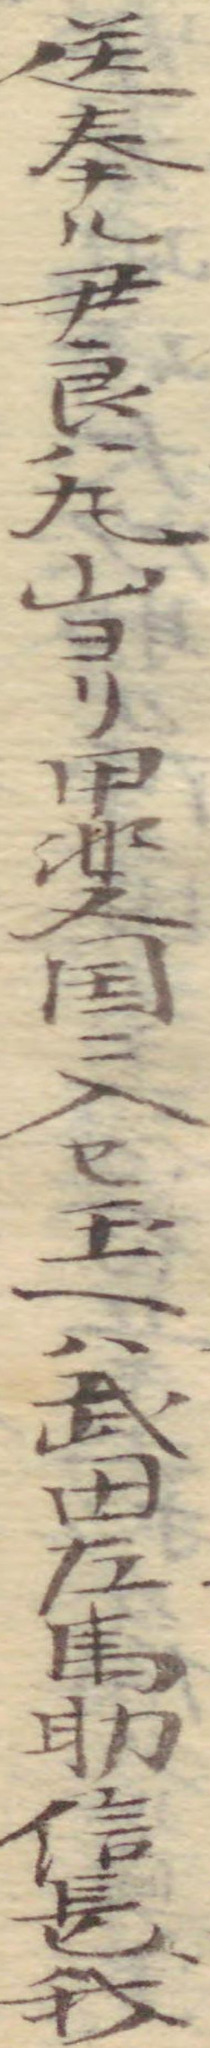送奉ル尹良ハ丸山ヨリ甲斐国ニ入セ玉ヘハ武田左馬助信長我
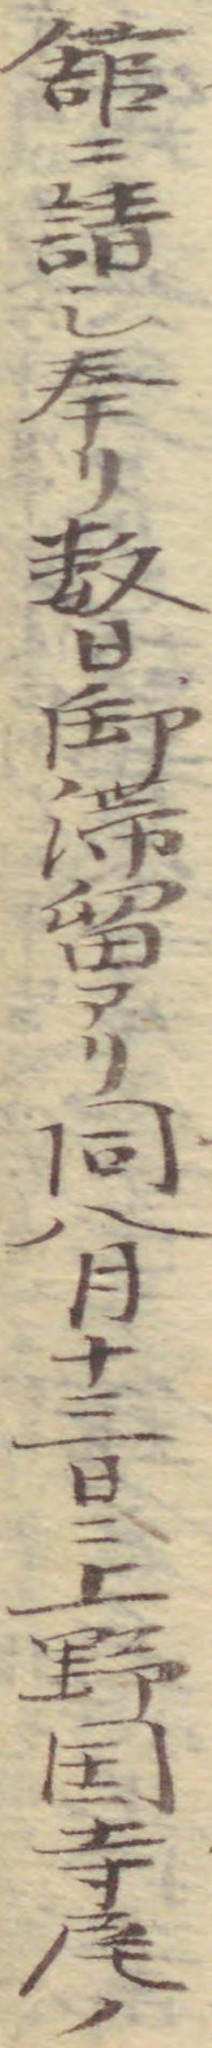館ニ請シ奉リ数日御滞留アリ同八月十三日ニ上野国寺尾ノ
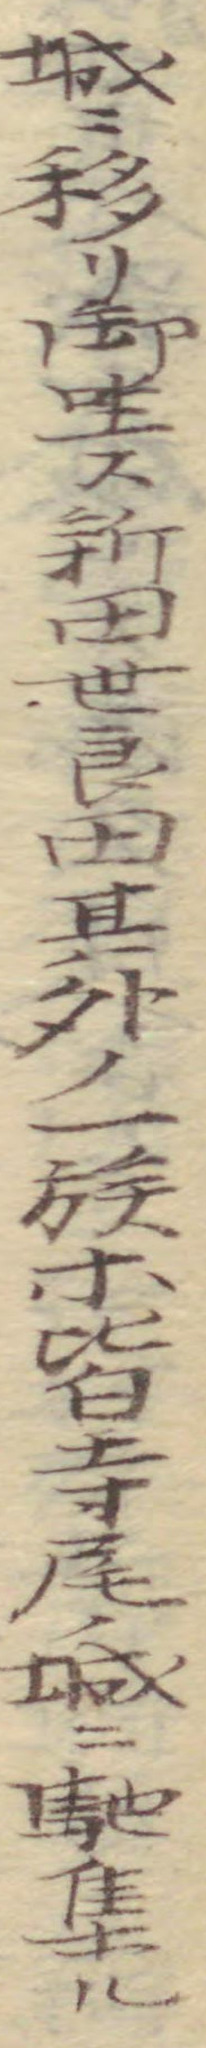城ニ移リ御坐ス新田世良田其外ノ一族等皆寺尾ノ城ニ馳集ル
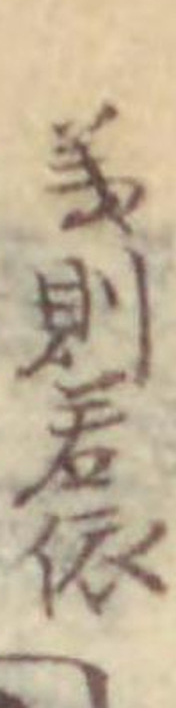義則若依
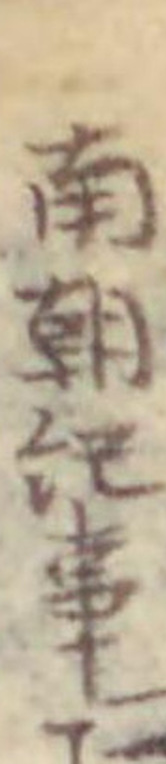南朝記事
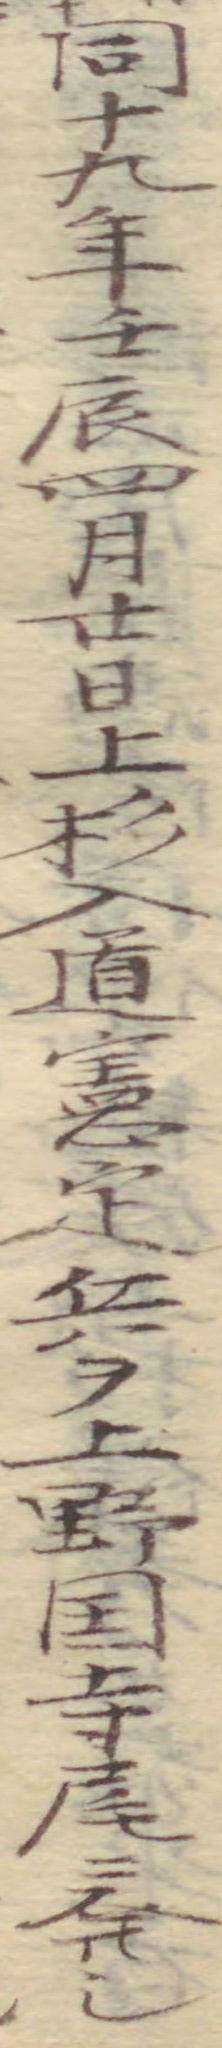同十九年壬辰四月廿日上杉入道憲定兵ヲ上野国寺尾ニ発シ
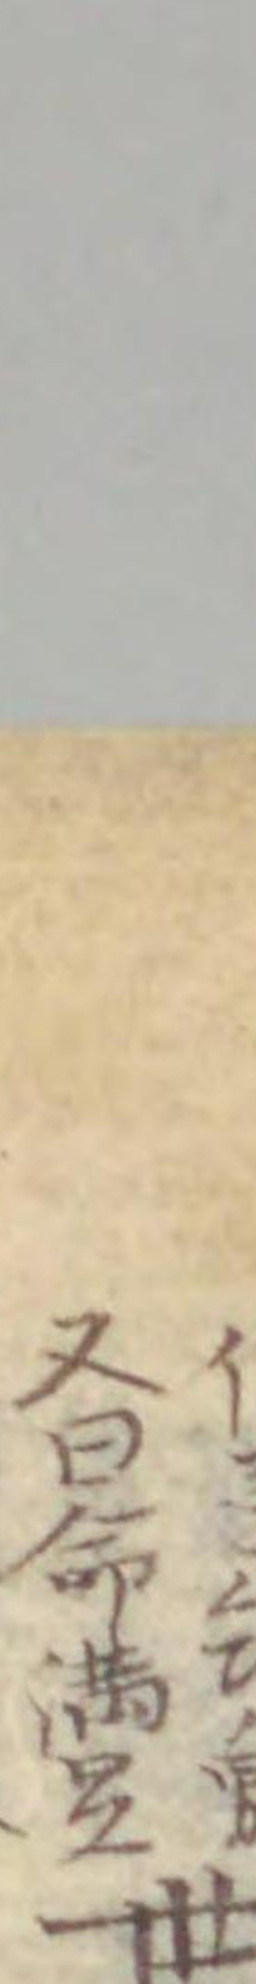又曰命満足
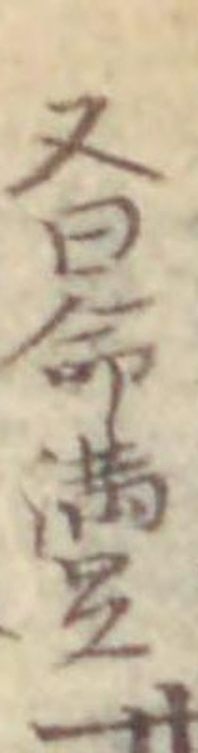又曰命満足
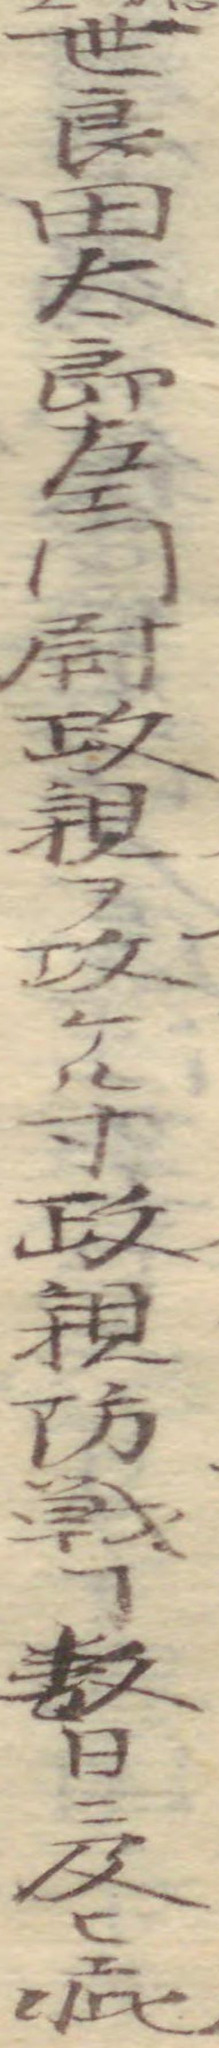世良田太郎左衛門尉政親ヲ攻ケル寸政親防戦コト数日ニ及ヒ疵
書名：鶯宿雑記. 巻199-200
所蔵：国立国会図書館 National Diet Library, JAPAN
